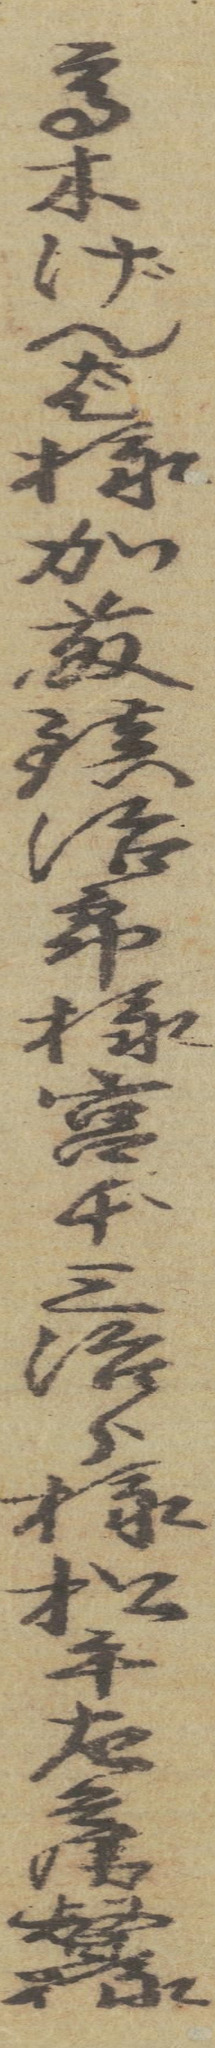高木げんば様加藤鎮治郎様宮本三治郎様松平左兵衛督様
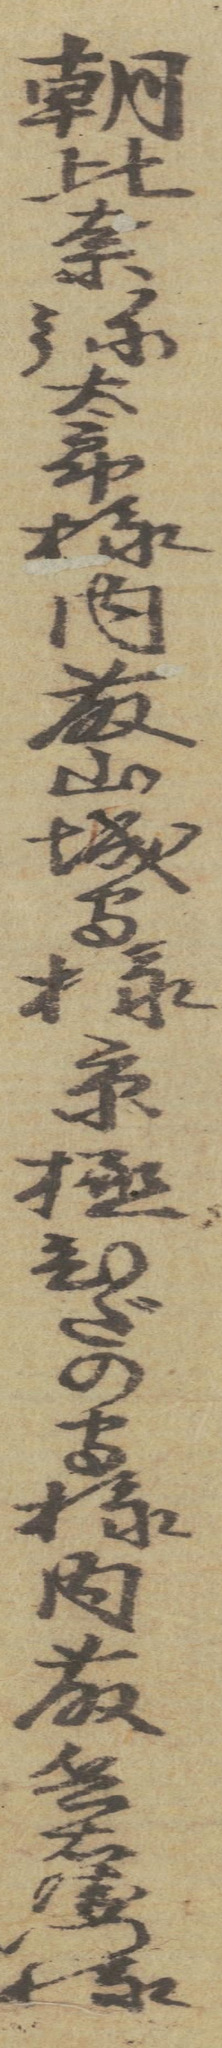朝比奈弥太郎様内藤山城守様京極ひだの守様内藤兵右衛門様
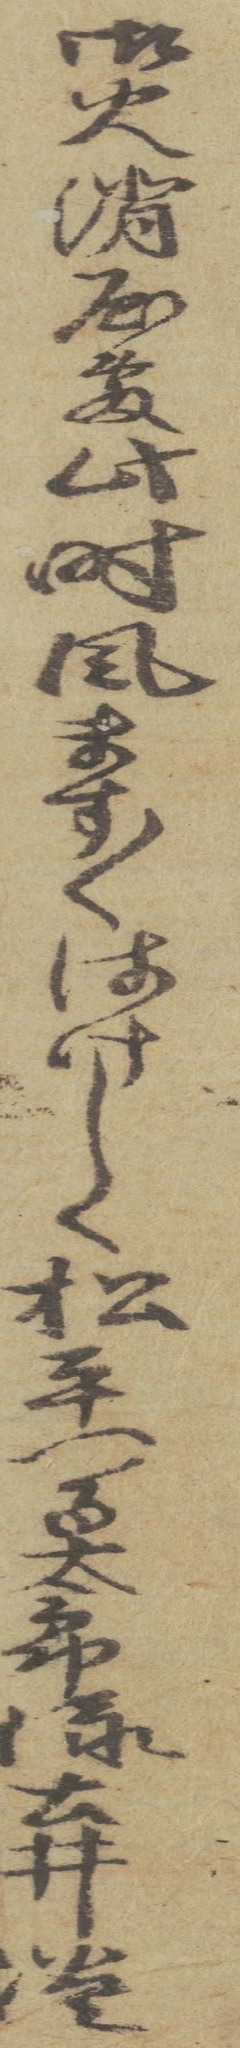御火消屋敷此時風ます〳〵はけしく松平つる太郎様土井淡
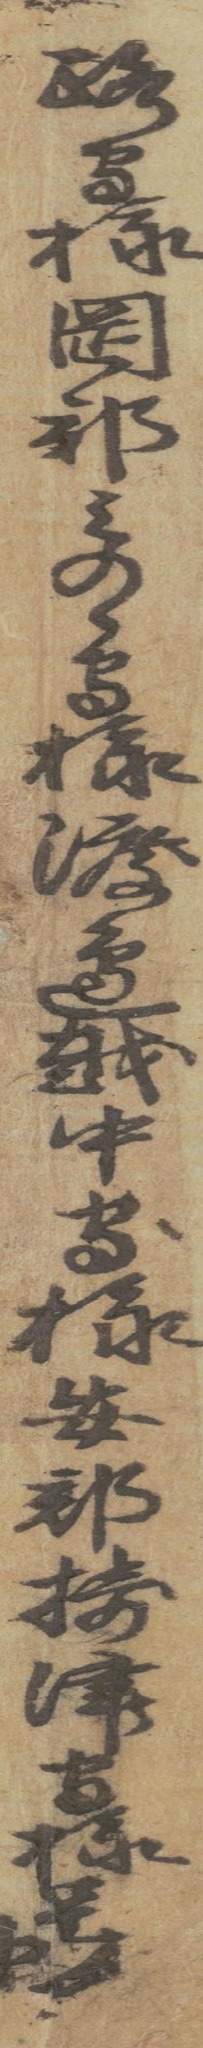路守様岡部ミのゝ守様渡辺越中守様安部摂津守様是？下？
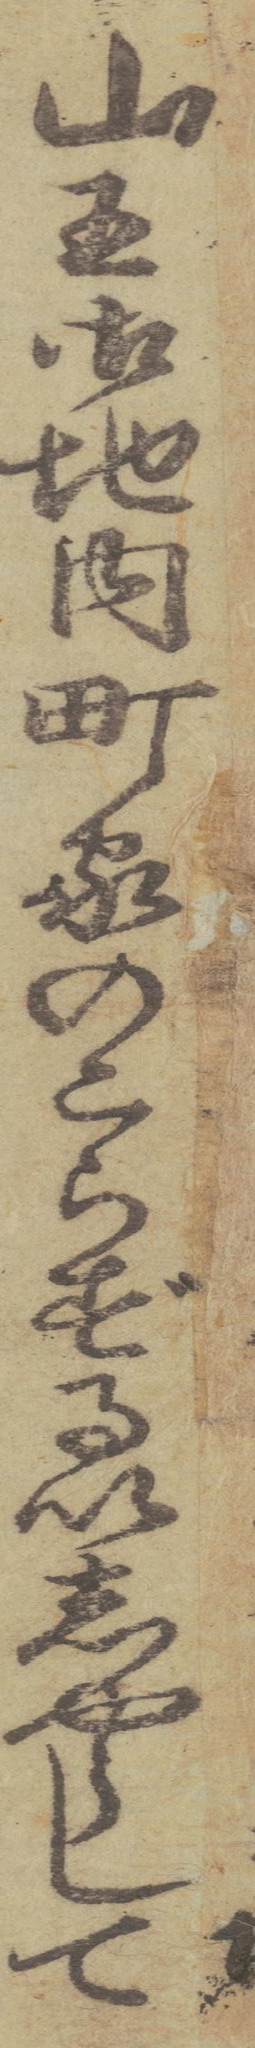山王御地内町家のこらずるいしやうして
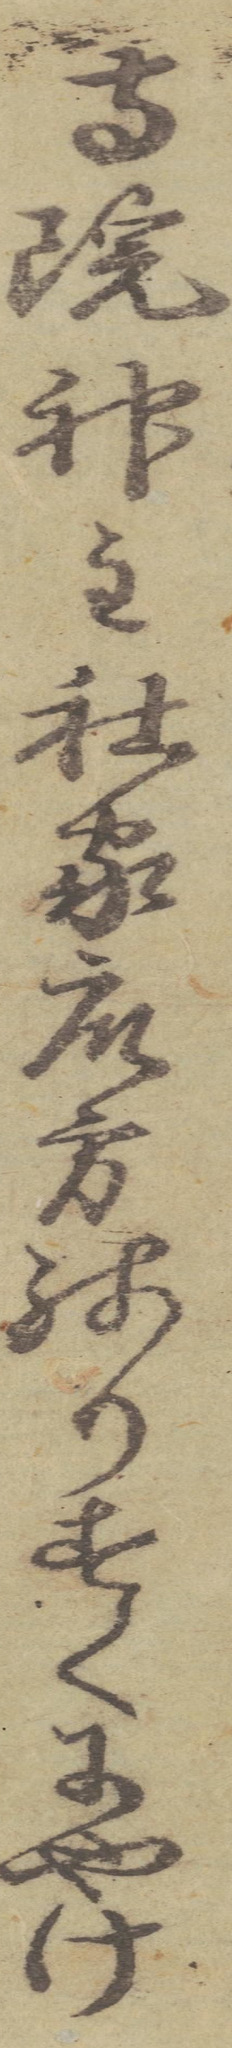寺院神主社家衆方残りすくにやけ
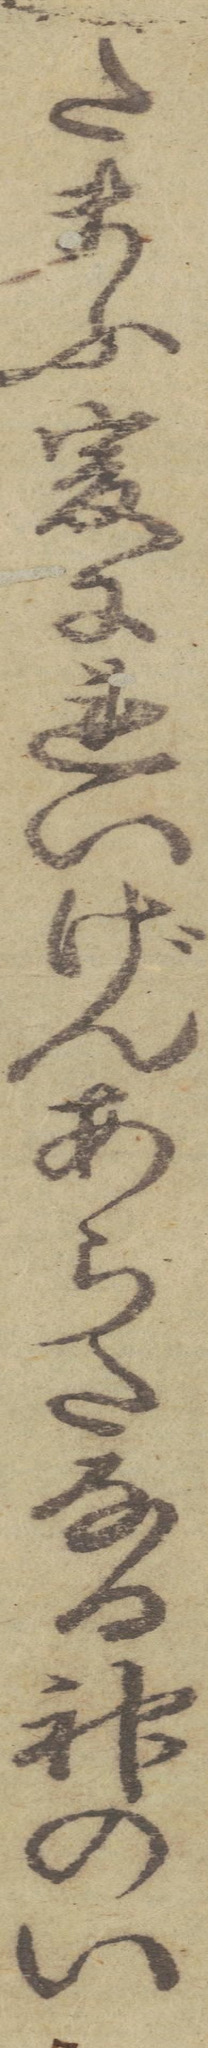たまふ爰にれいげんあらたなる神のい
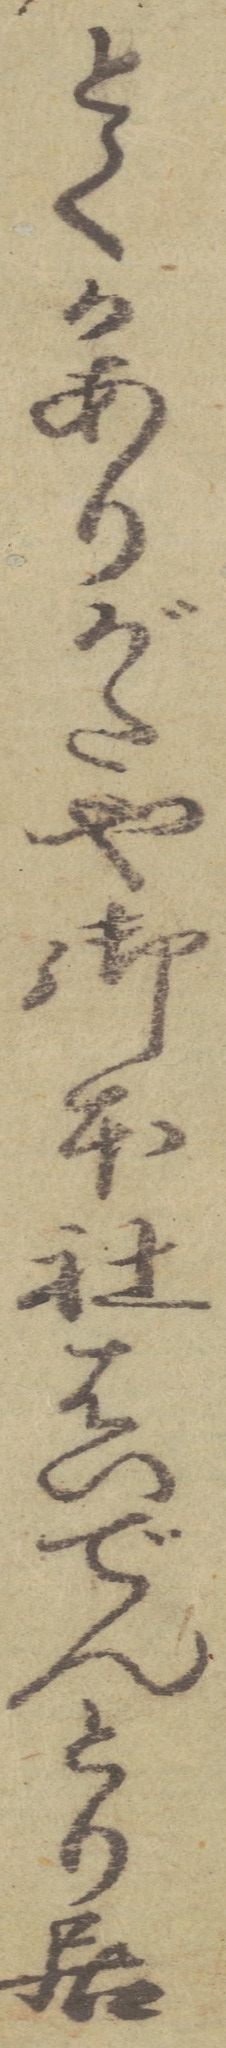とくかありがたや御本社はいでんとり居
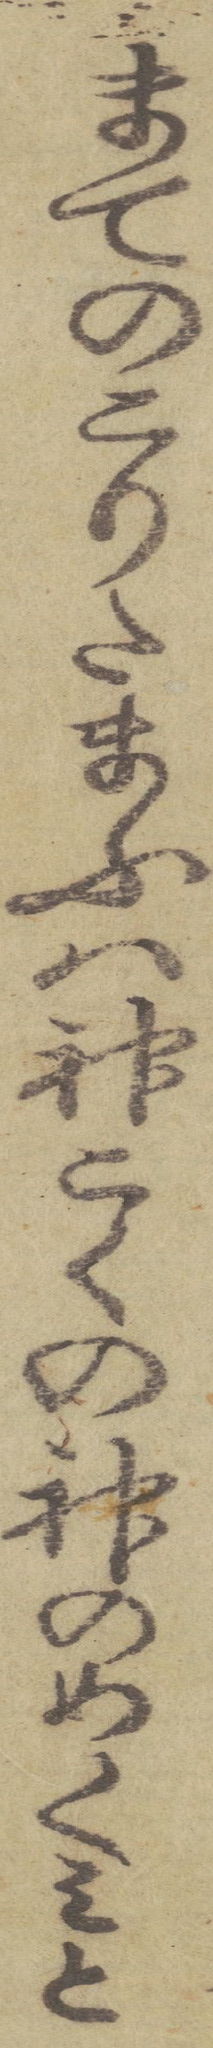まてのこりたまふは神こくの神のめくみと
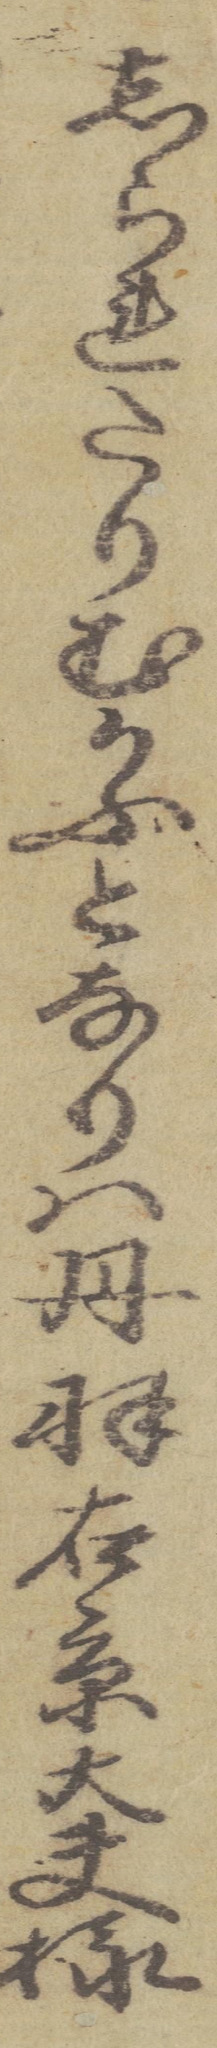しられたりむかふとなりは丹羽右京大夫様
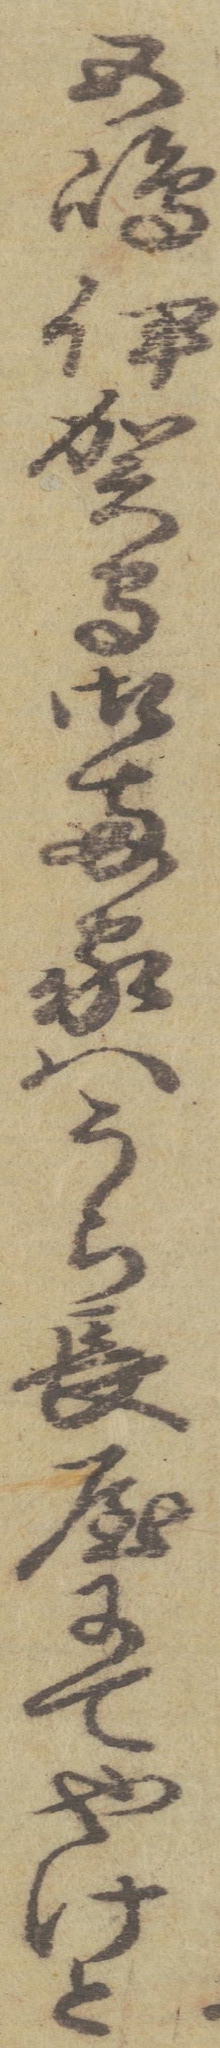五嶋伊賀守御両家はうら長屋にてやけと
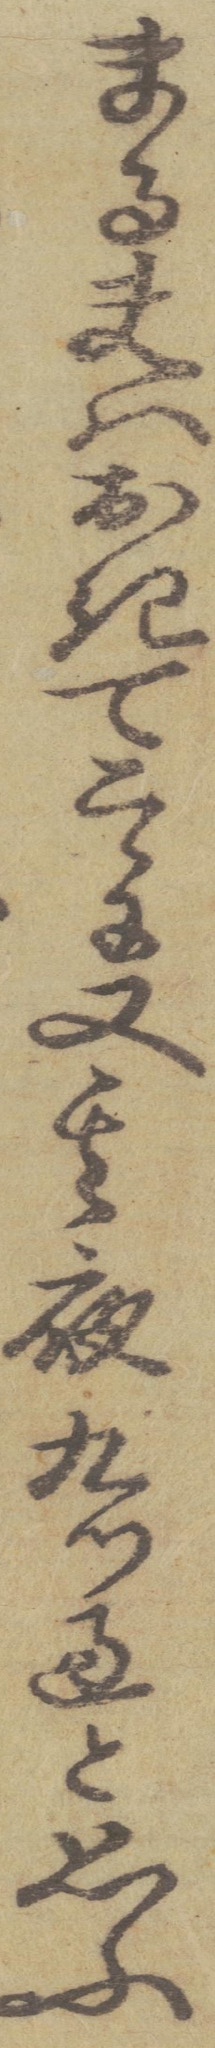まる夫はおきてこゝに又其夜九ツ過と思ふ
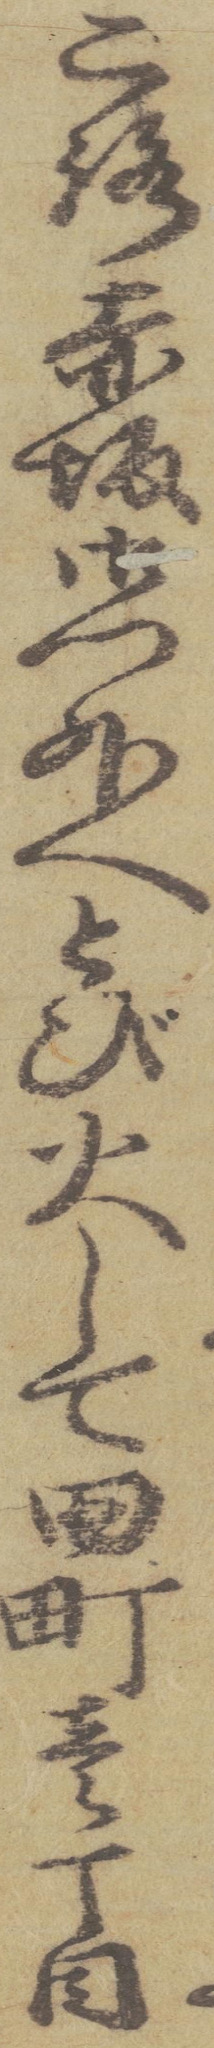ころ赤坂御門外へとび火して田町壱丁目
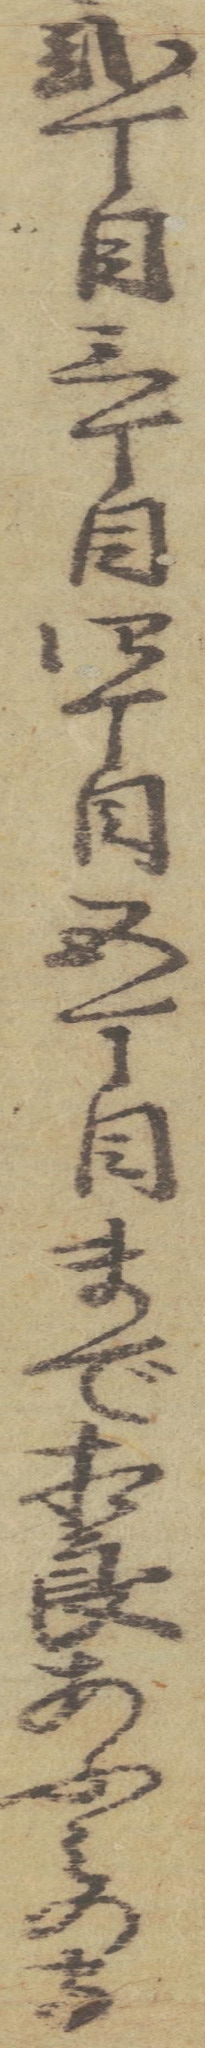弐丁目三丁目四丁目五丁目まで相良あふみの守
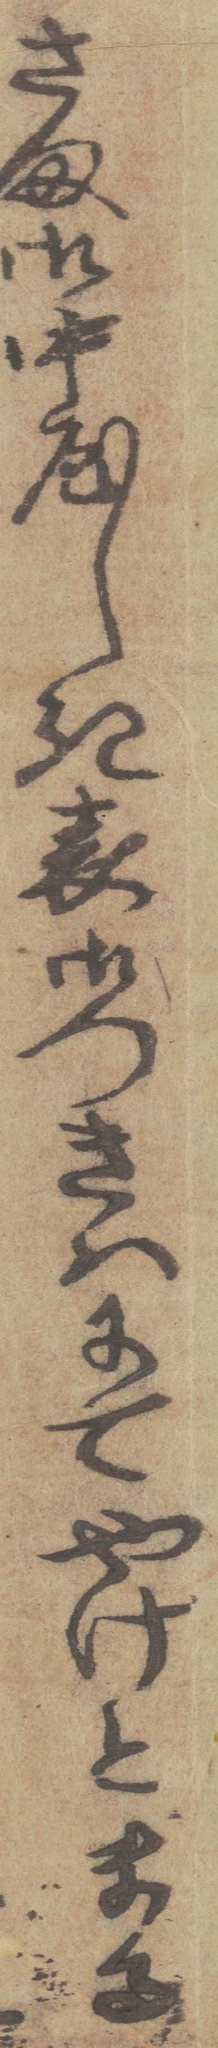さま中屋しき表御門きはにてやけとまる
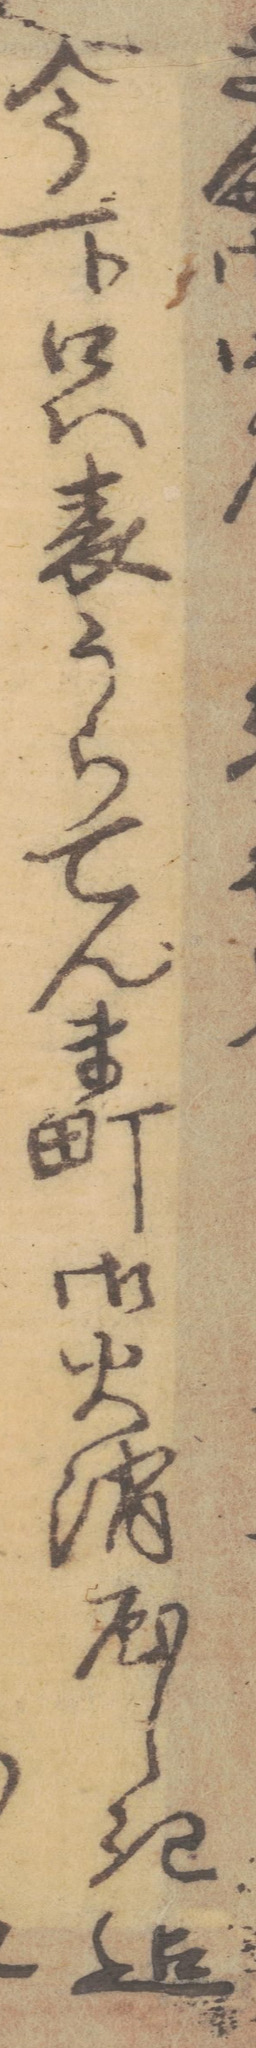今一ト口ハ表うらてんま町御火消屋しき迄
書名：類焼道しるべ
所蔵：東京大学地震研究所図書室 Earthquake Research Institute Library, The University of Tokyo, JAPAN
